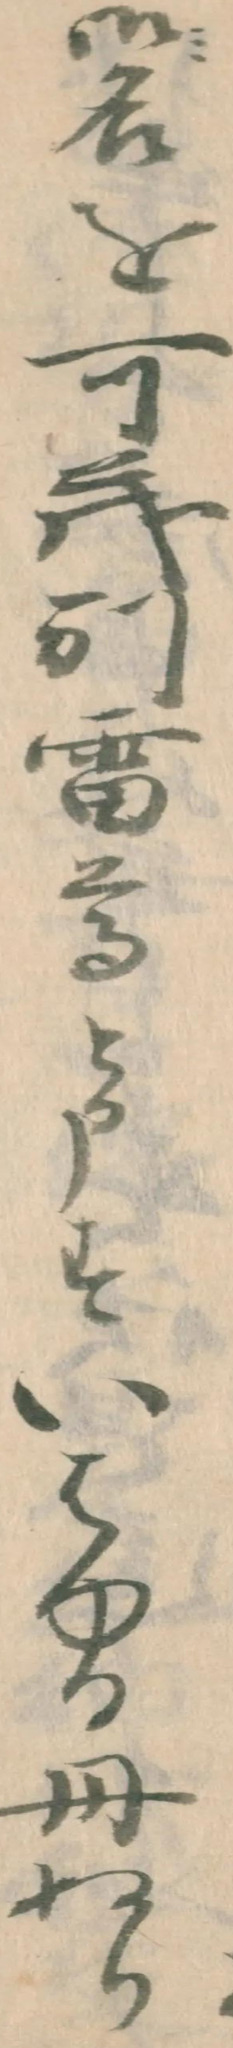御名を可茂別雷尊と申すいはゆる丹ぬり
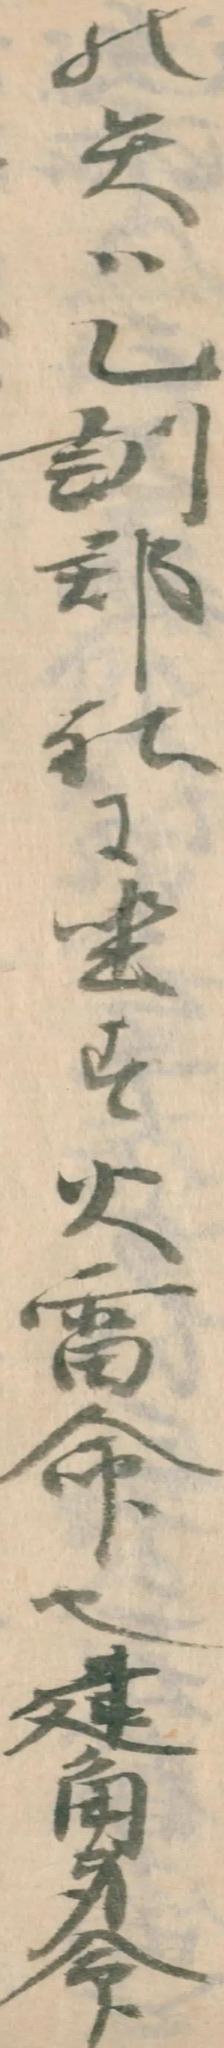の矢は乙訓郡社に坐す火雷命也建角身命
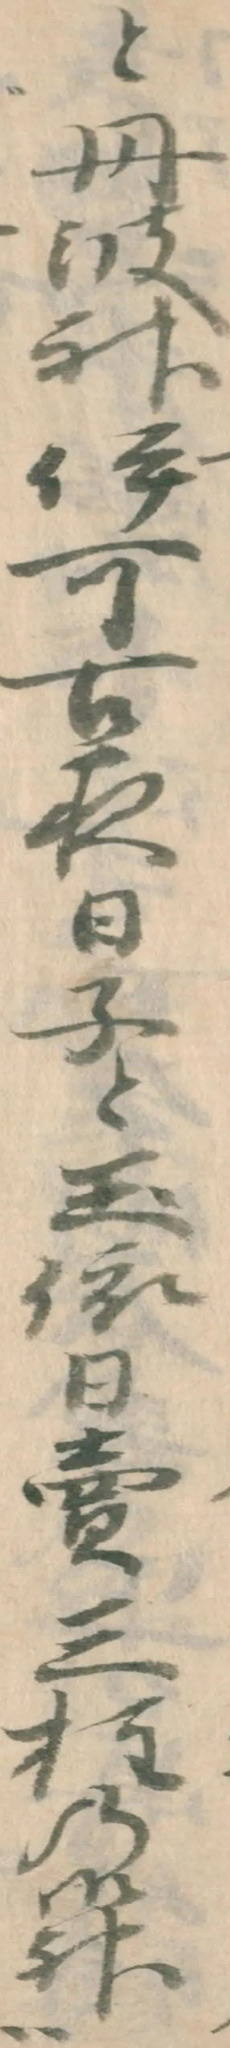と丹波神伊可古夜日子と玉依日売三柱の御神は
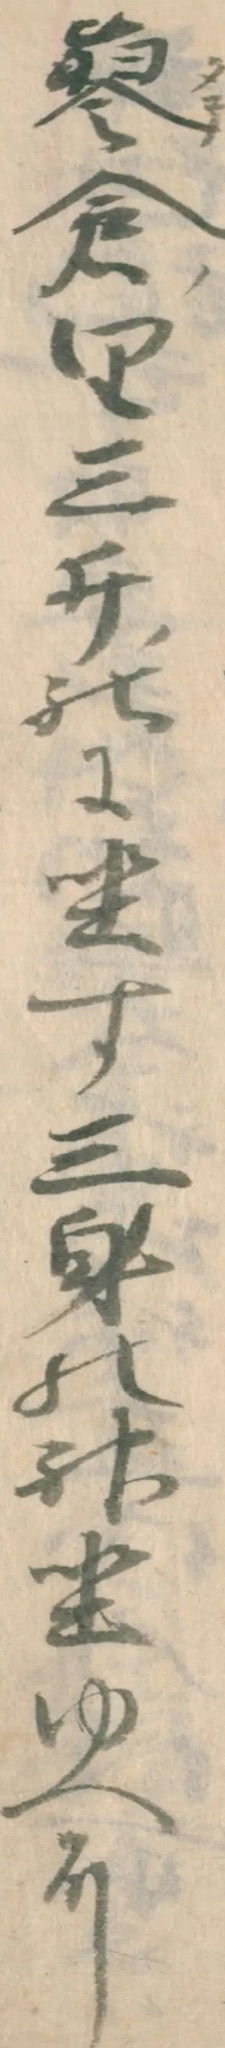蓼倉里三井社に坐す三身の神坐ゆへに
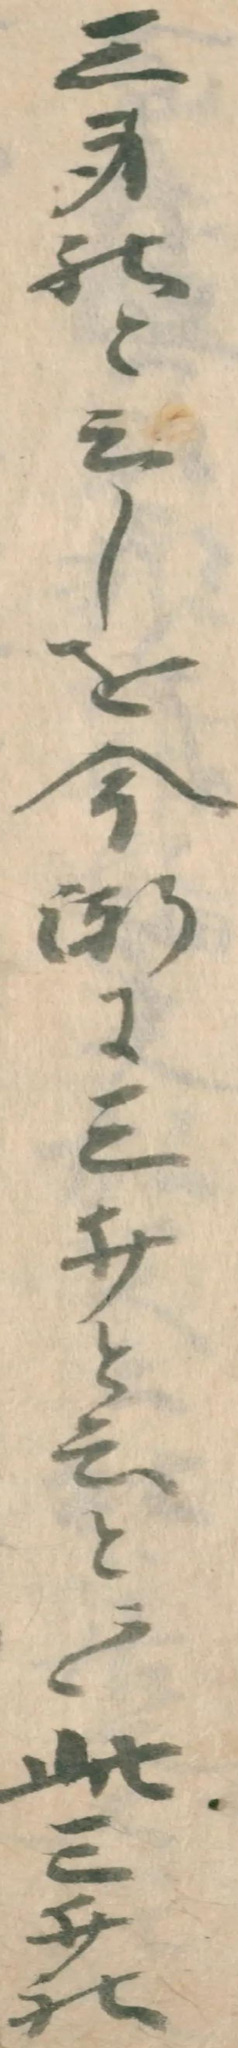三身社と云しを今漸に三井と云と云々此三井社
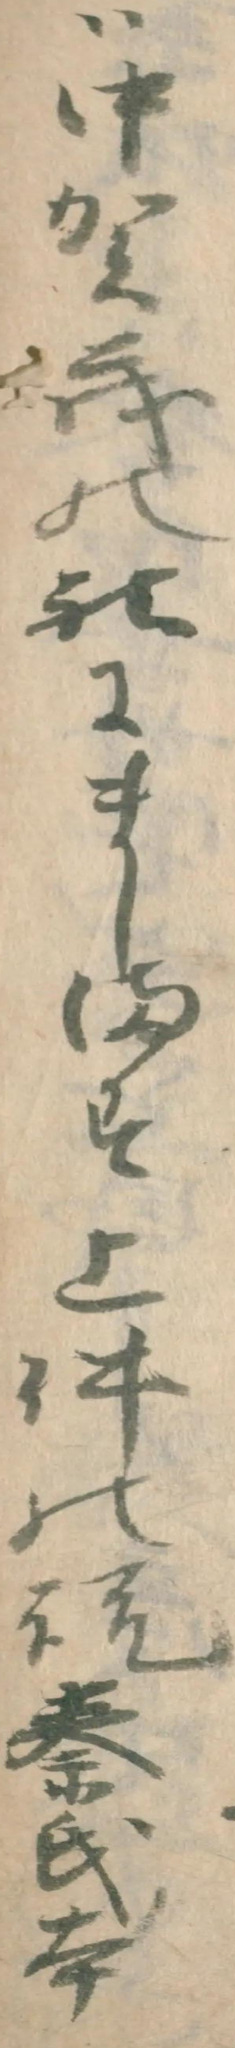は中賀茂の社にまします上件の説秦氏本

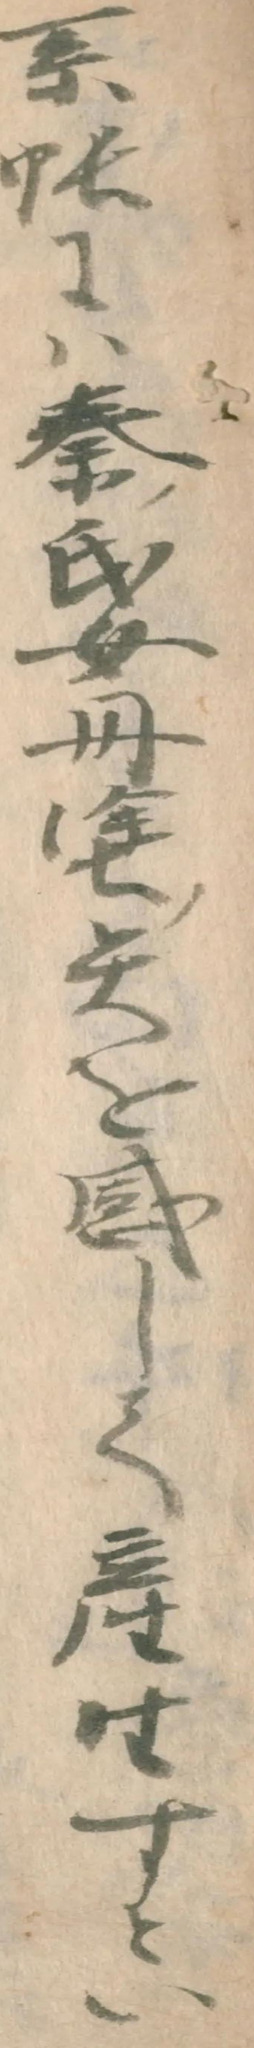系帳には秦氏女丹塗矢を感して産生すとい
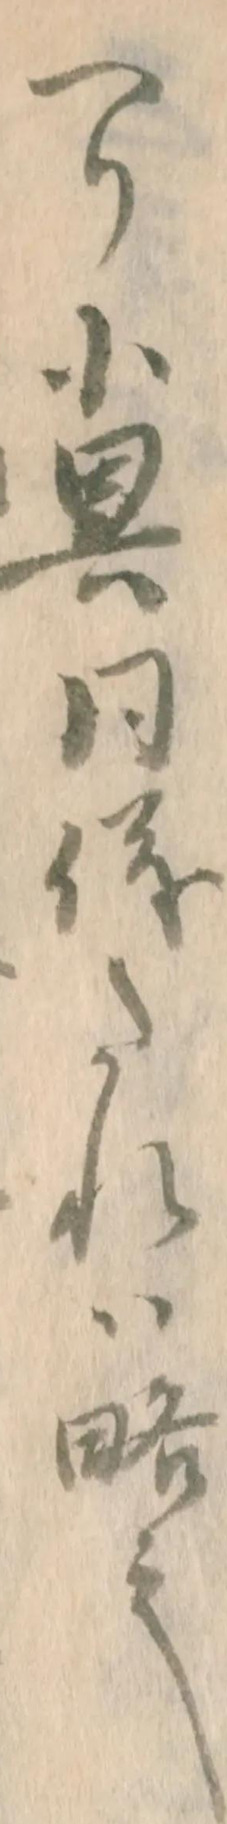へり小異同儀たれは略之
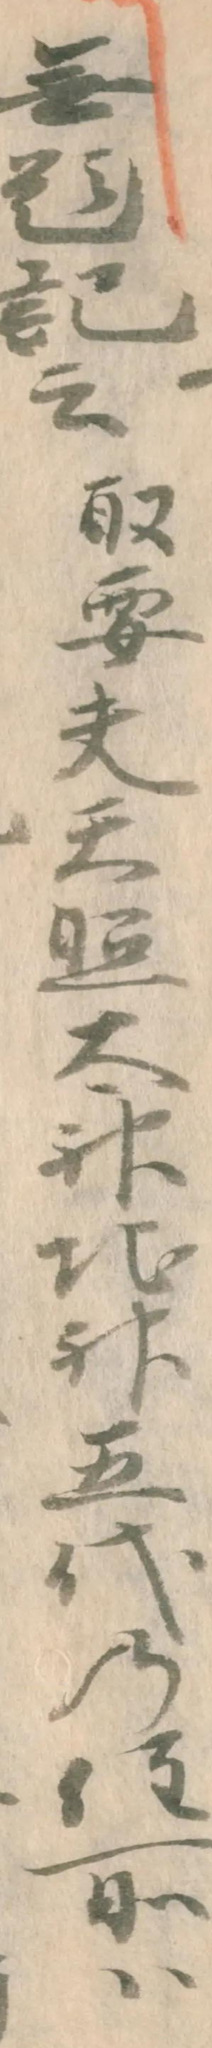無題記云取要夫天照太神地神五代の住所は
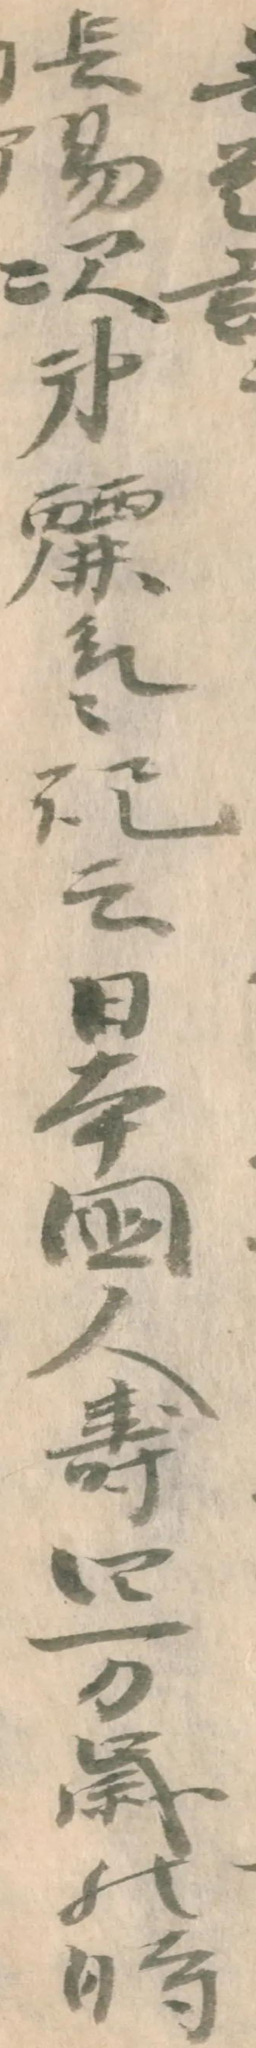陰陽次第麗気記云日本国人寿四万歳の時
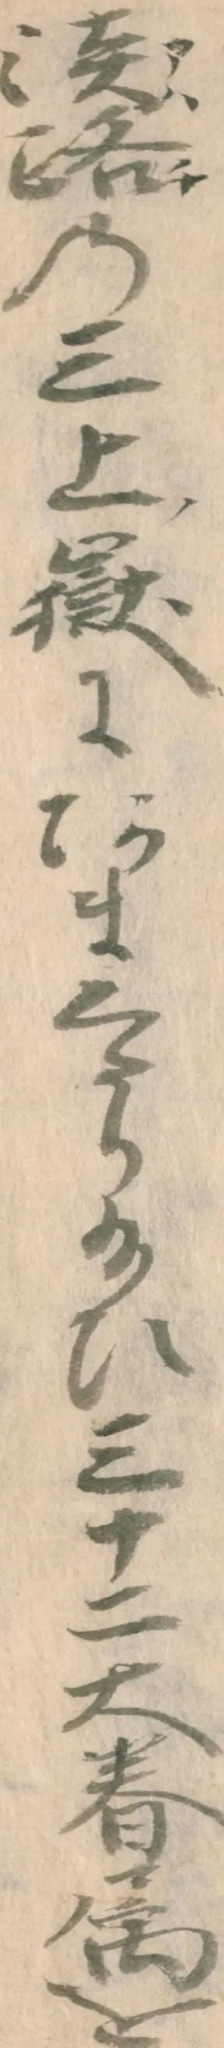淡路の三上嶽にあまくたり給ひ三十二大眷属を
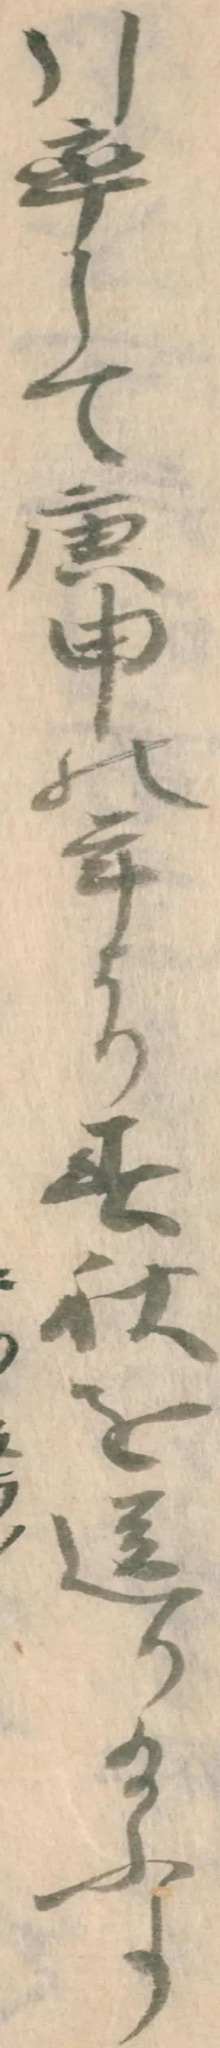引率して庚申の年より春秋を送り給ふ事
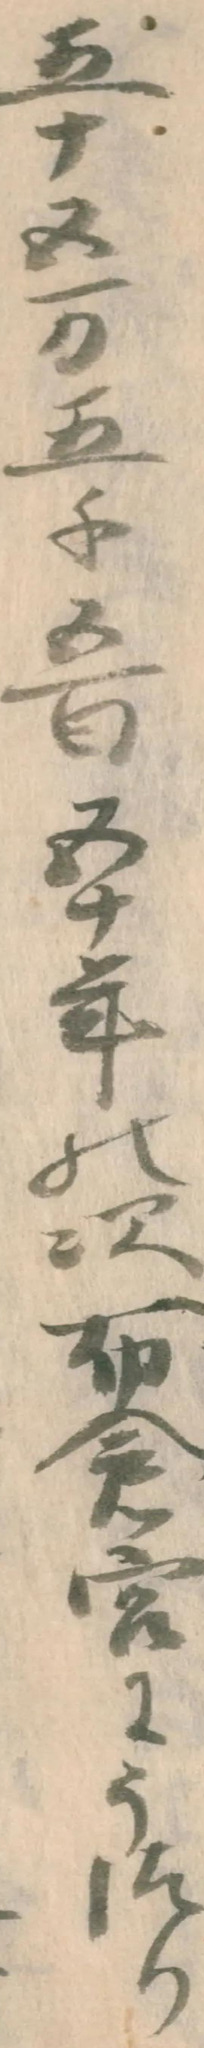五十五万五千五百五十年の次布倉宮にうつり
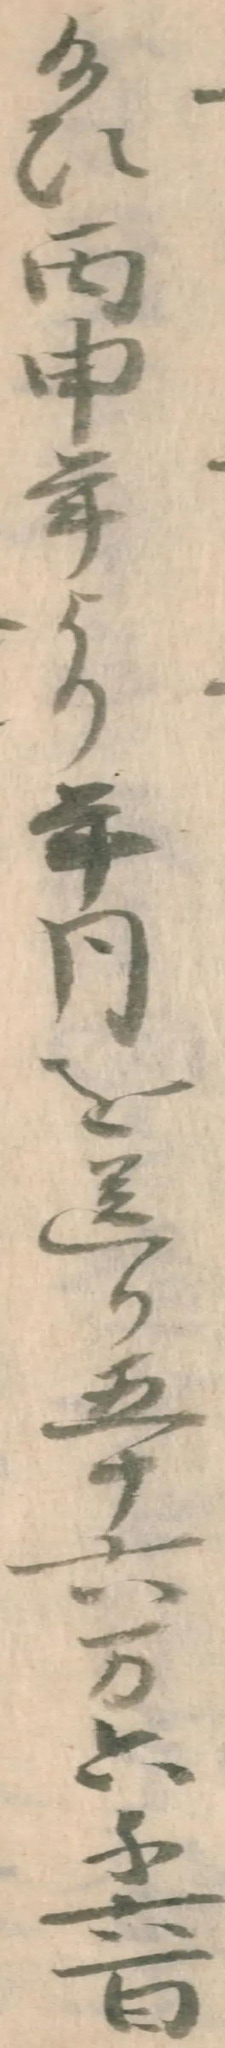給ひ丙申年より年月を送り五十六万六千六百
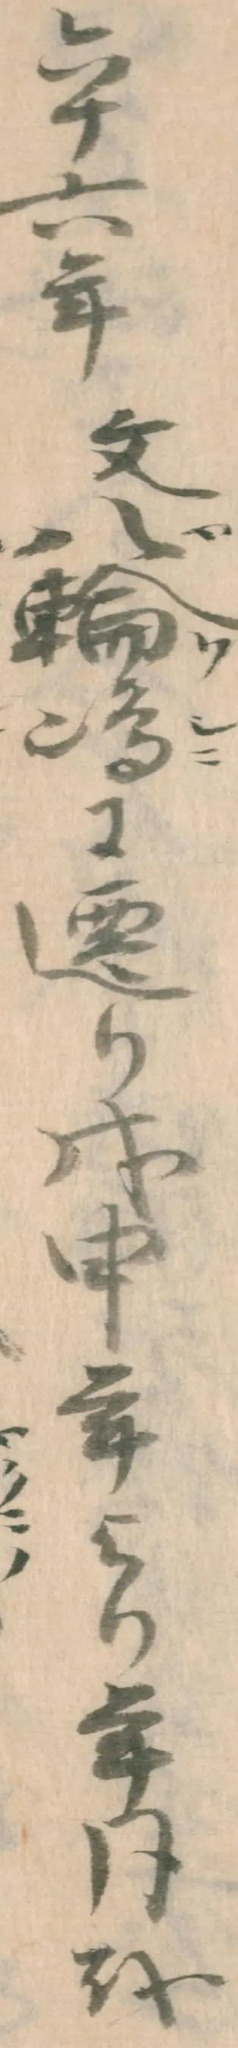六十六年文八輪嶋に遷り戊申年より年月を
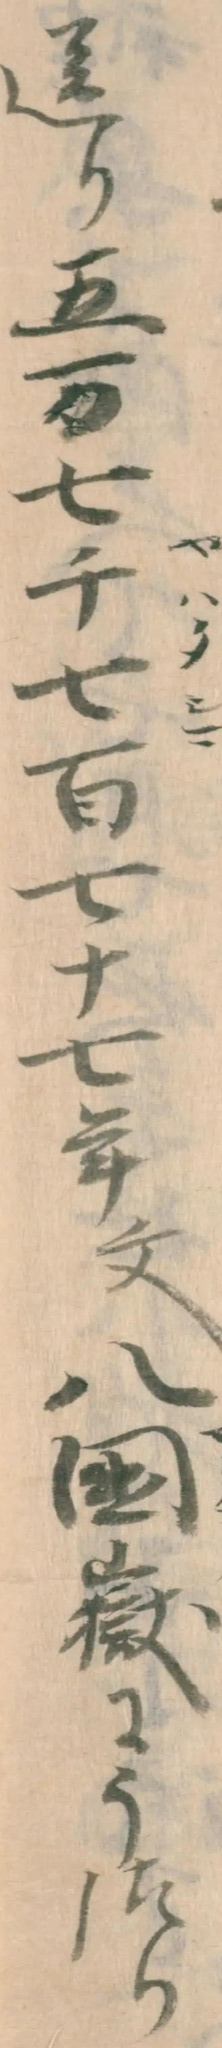送り五万七千七百七十七年文八国嶽にうつり
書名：賀茂社記録. 第1冊
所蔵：国立国会図書館 National Diet Library, JAPAN
